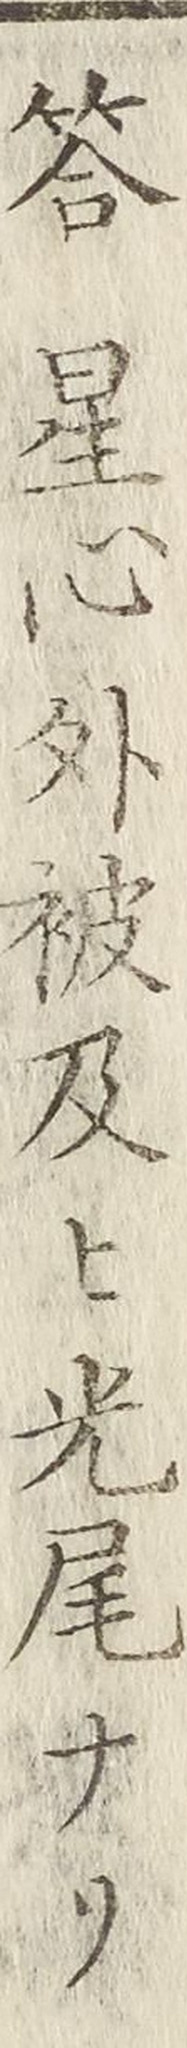答星心外被及ヒ光尾ナリ
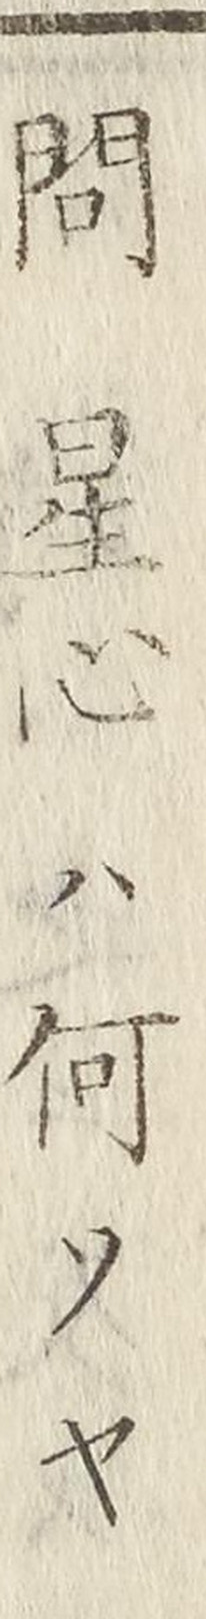問星心ハ何ソヤ
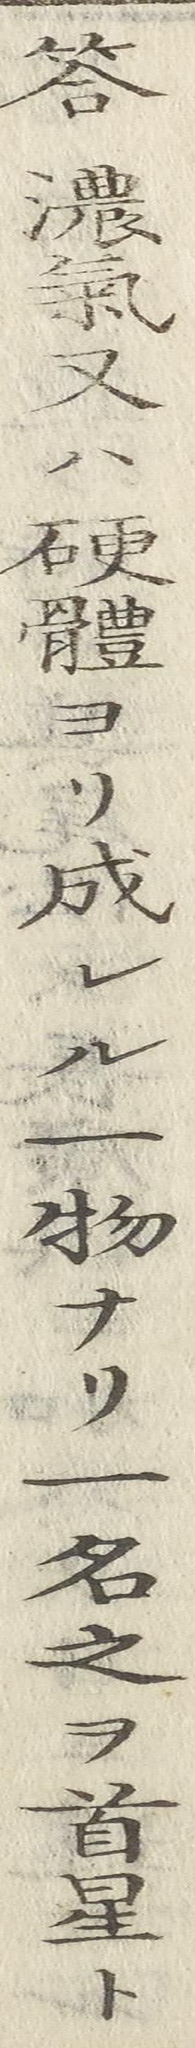答濃気又ハ硬体ヨリ成レル一物ナリ一名之ヲ首星ト
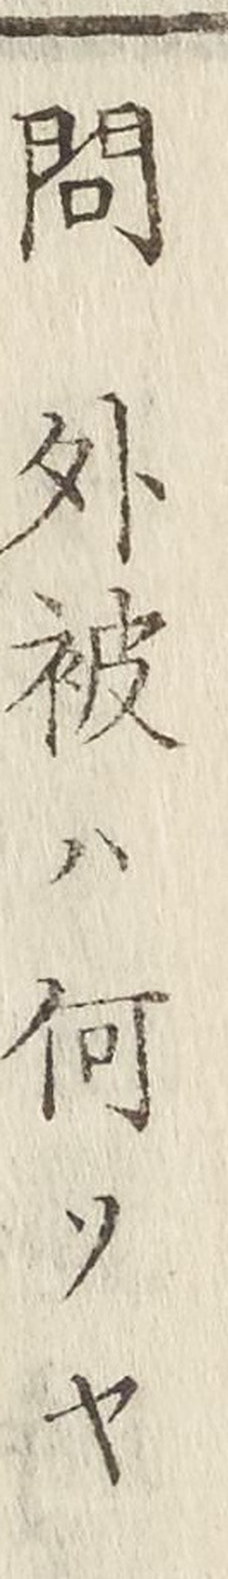問外被ハ何ソヤ
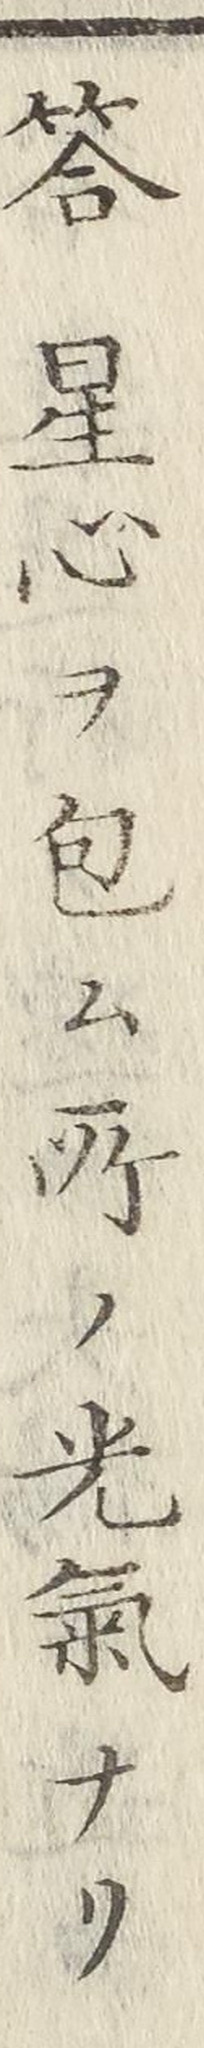答星心ヲ包ム所ノ光気ナリ
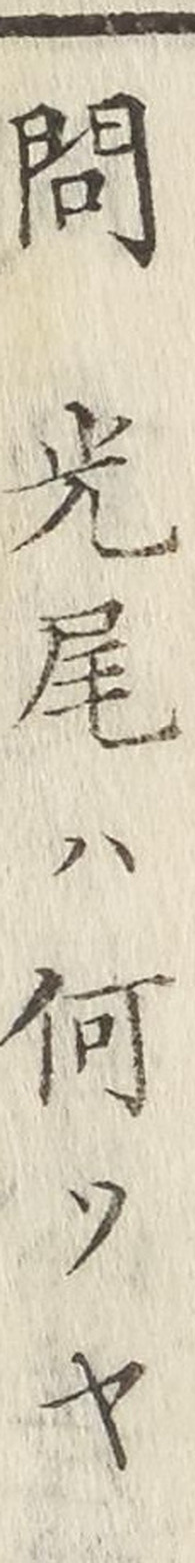問光尾ハ何ソヤ
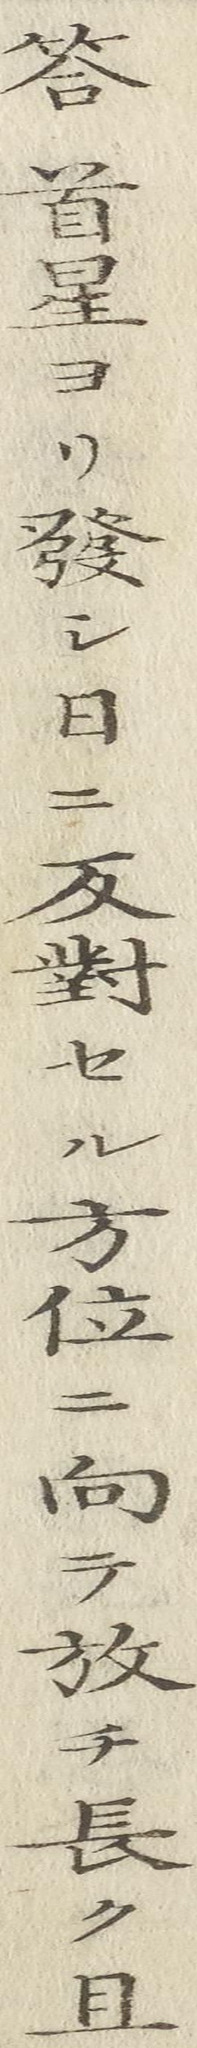答首星ヨリ発シ日ニ反射セル方位ニ向テ放チ長ク且

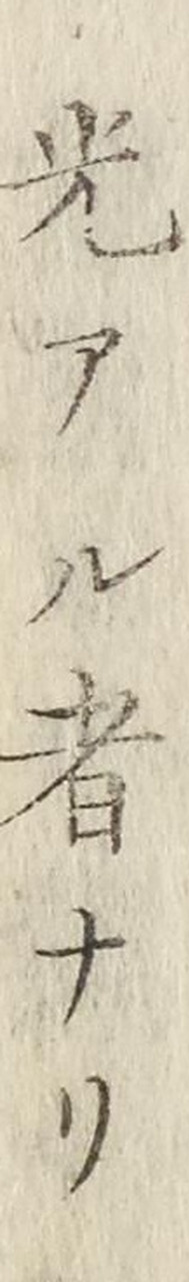光アル者ナリ
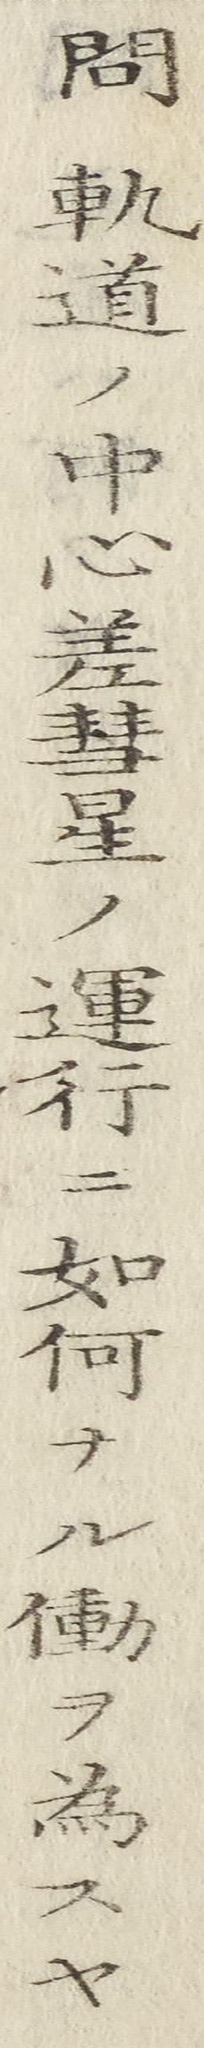問軌道ノ中心差彗星ノ運行二如何ナル働ヲ為スヤ
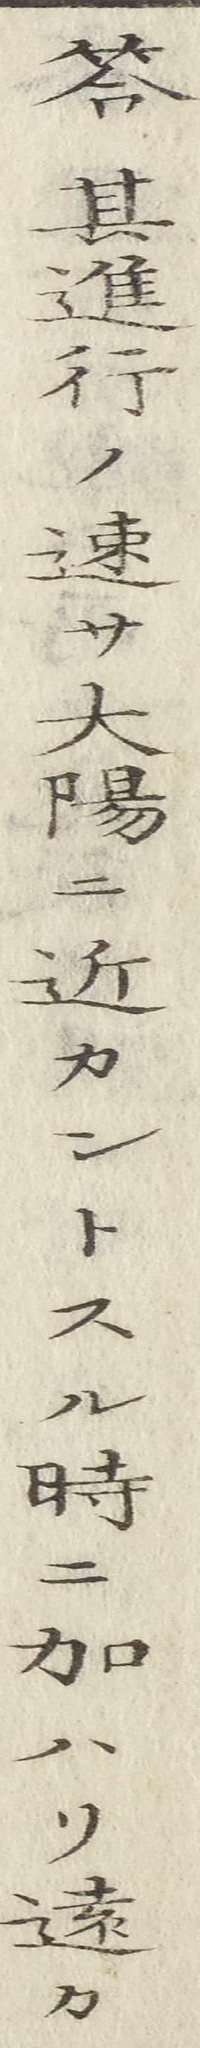答其進行ノ速サ大陽ニ近カントスル時二加ハリ遠カ
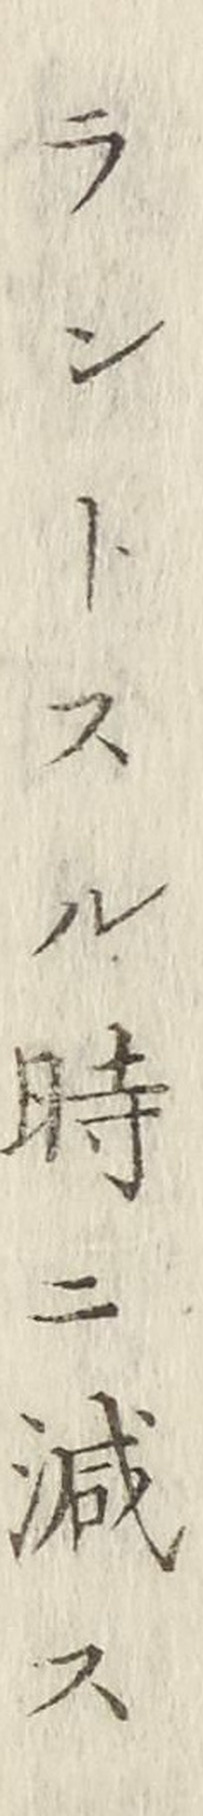ラントスル時二減ス
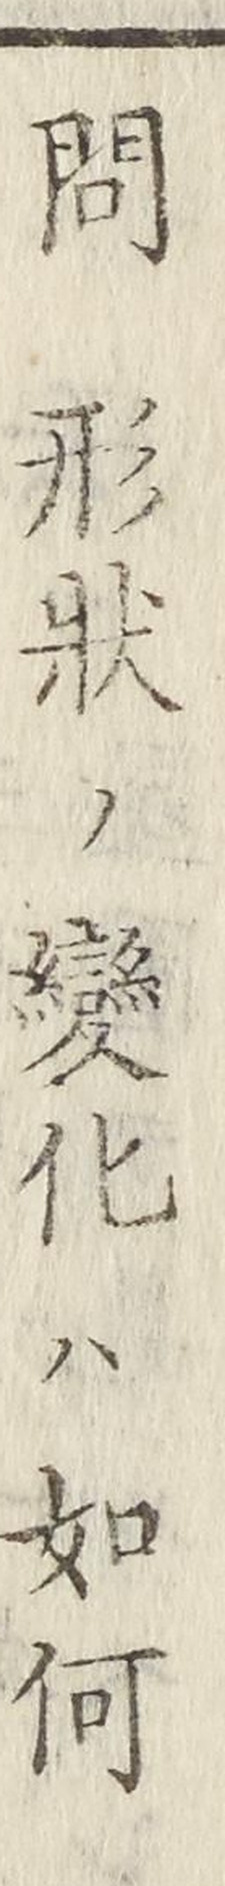問形状ノ変化ハ如何
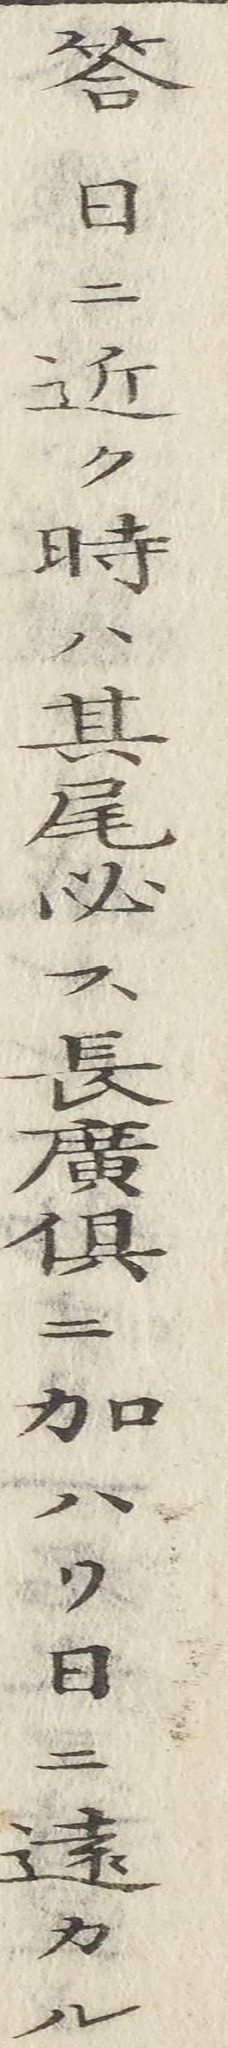答日ニ近ク時ハ其尾必ス長広俱ニ加ハリ日ニ遠カル
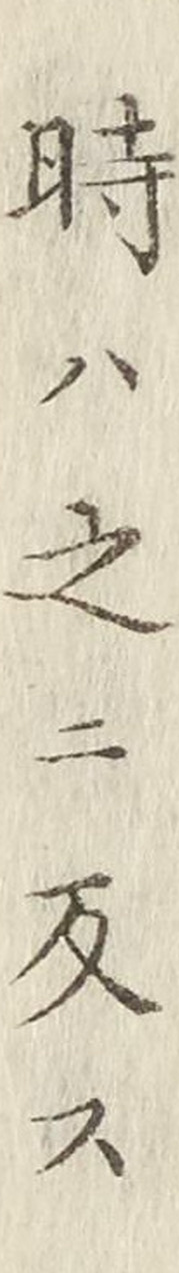時ハ之ニ反ス
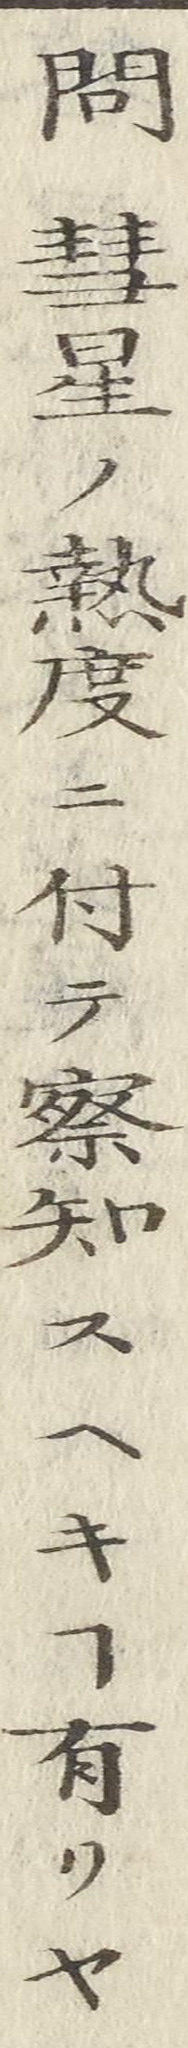問彗星ノ熱度ニ付テ察知スヘキコト有リヤ
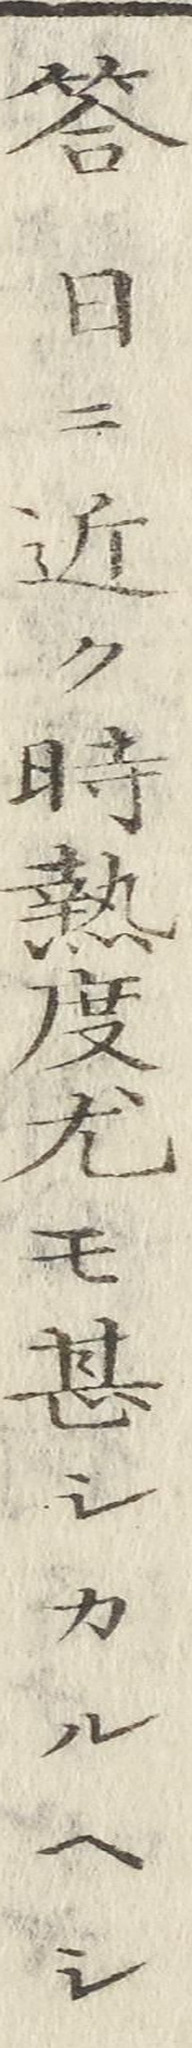答日ニ近ク時熱度尤モ甚シカルヘシ
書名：星学圖説　下
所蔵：東京大学地震研究所図書室 Earthquake Research Institute Library, The University of Tokyo, JAPAN
